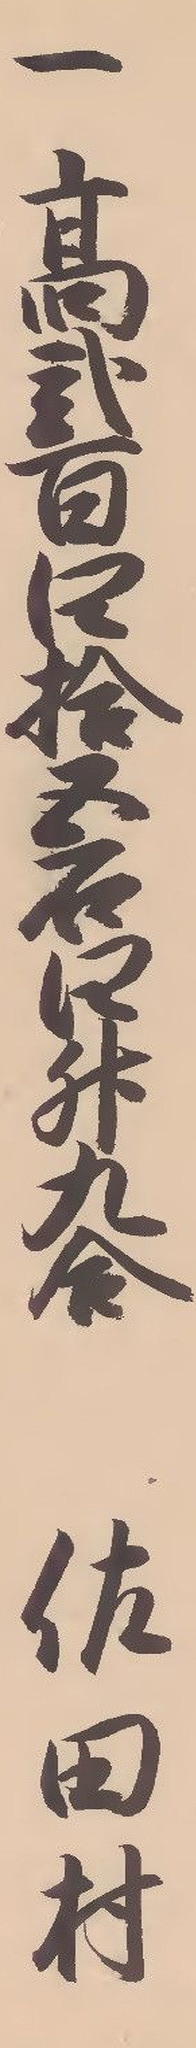一高弐百四拾五石四升九合佐田村

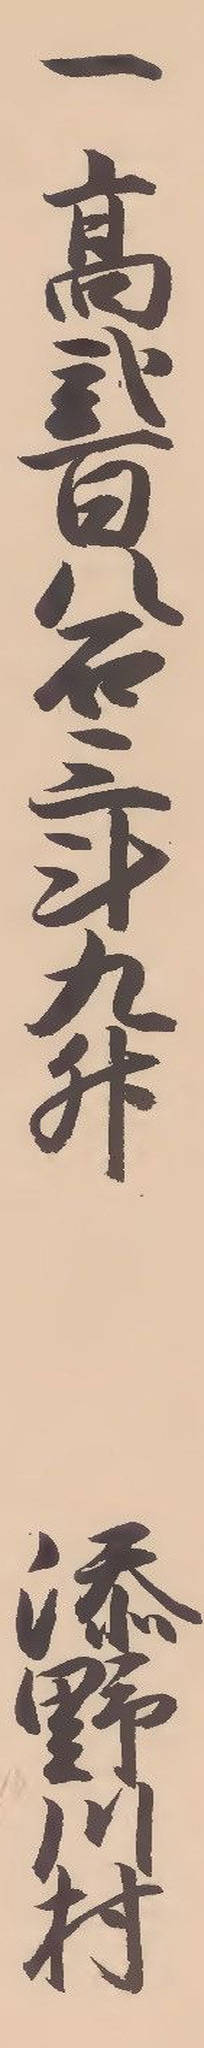一高弐百八石三斗九升添野川村
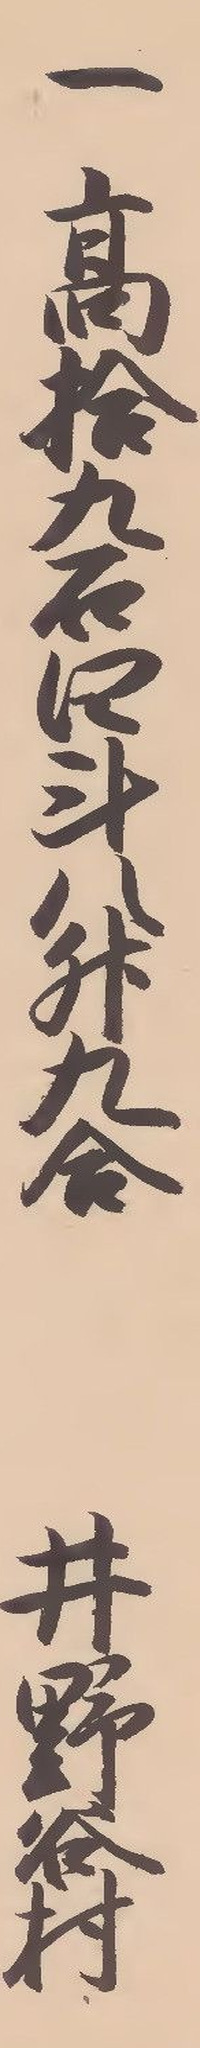一高拾九石四斗八升九合井野谷村
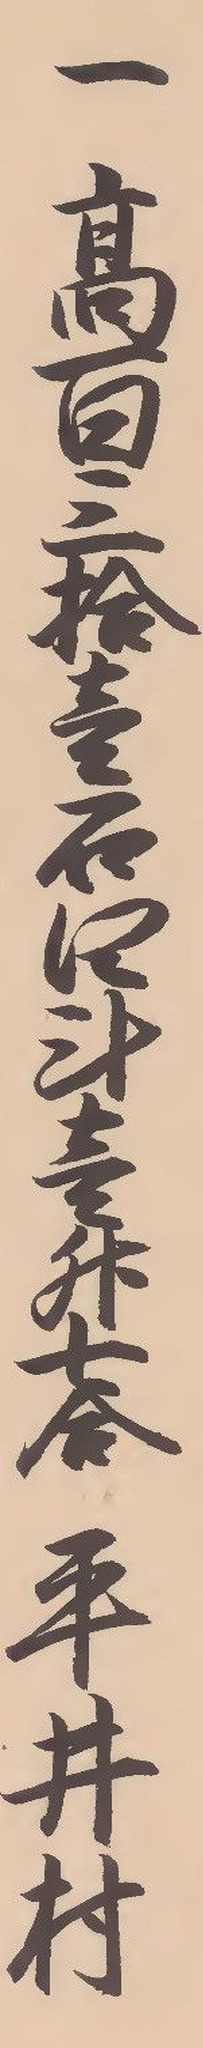一高百三拾壱石四斗壱升七合平井村
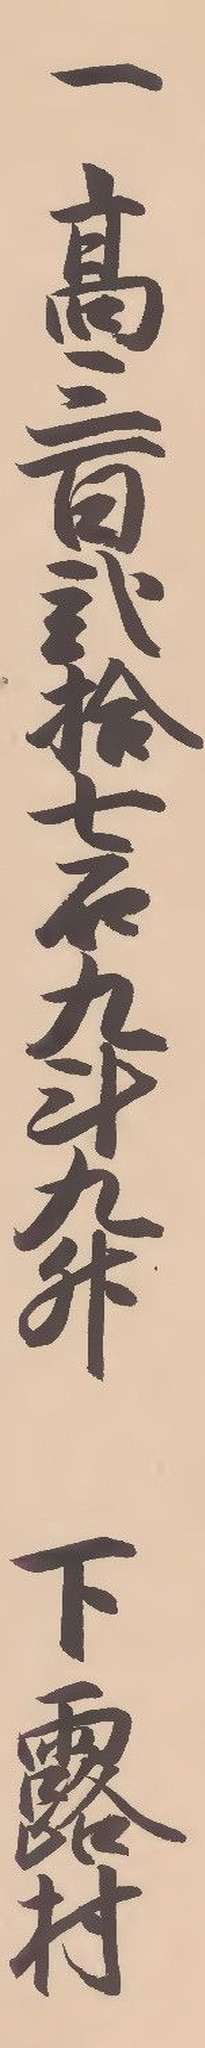一高三百弐拾七石九斗九升下露村
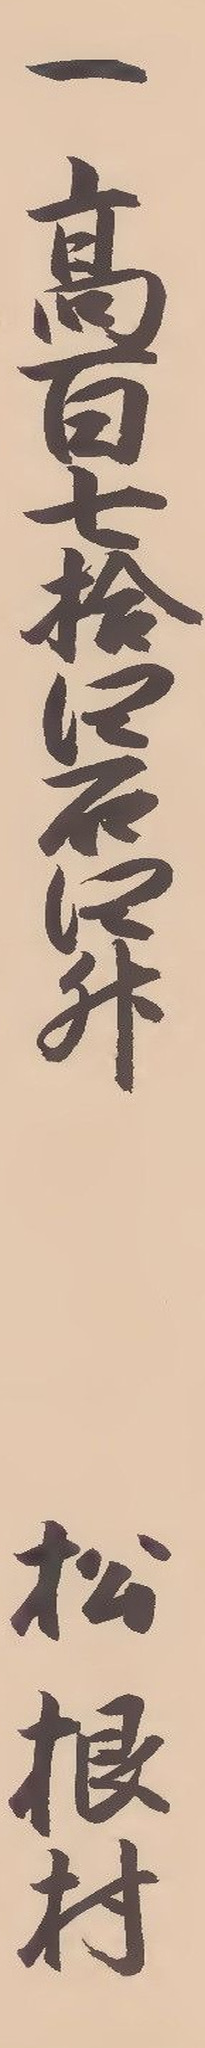一高百七拾四石四升松根村
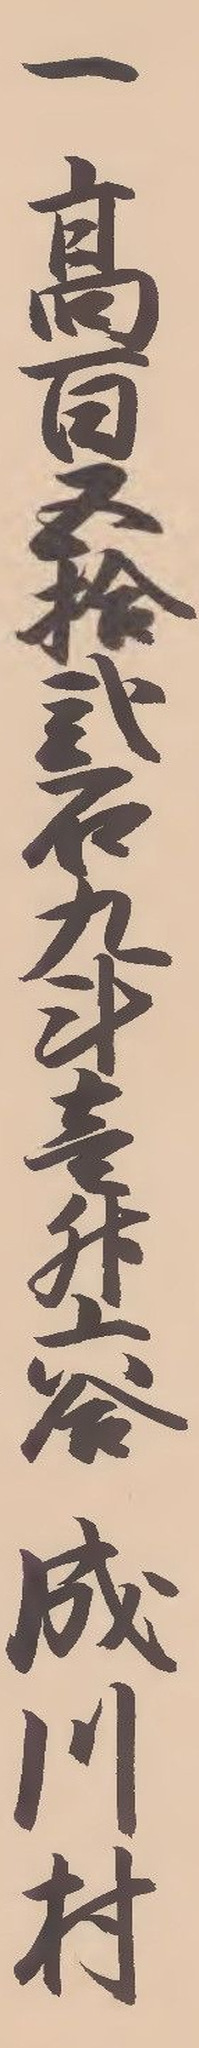一高百五拾弐石九斗壱升六合成川村
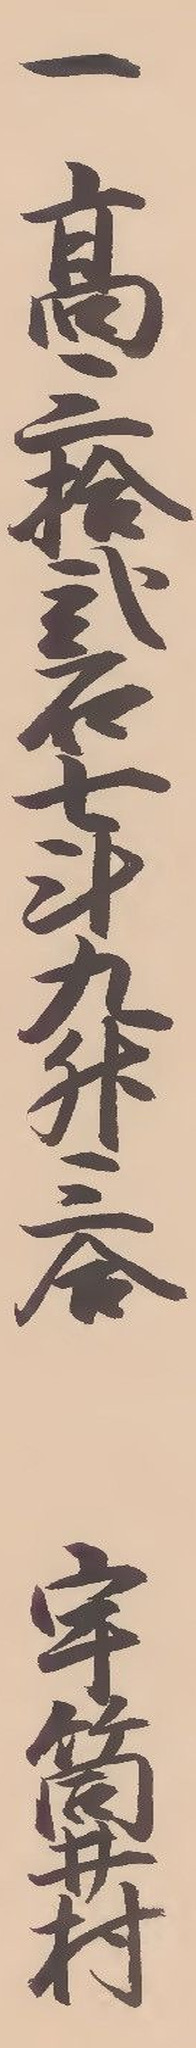一高三拾弐石七斗九升三合宇筒井村

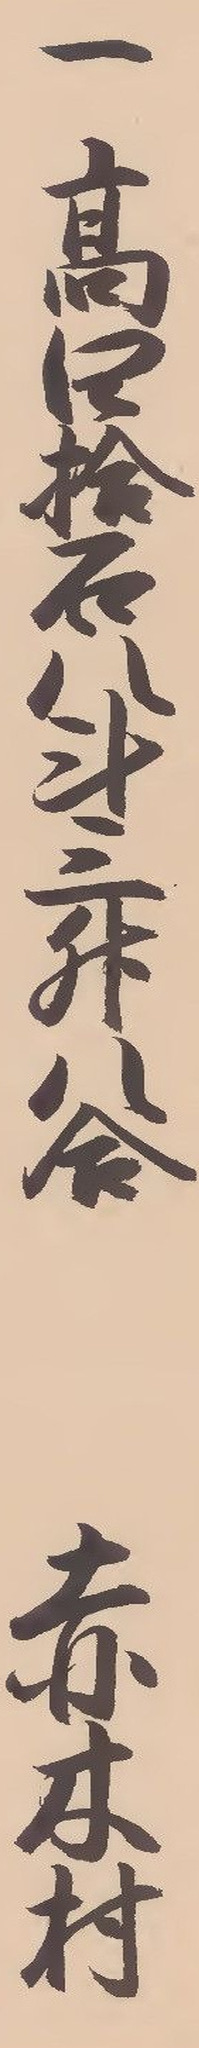一高四拾石八斗三升八合赤木村
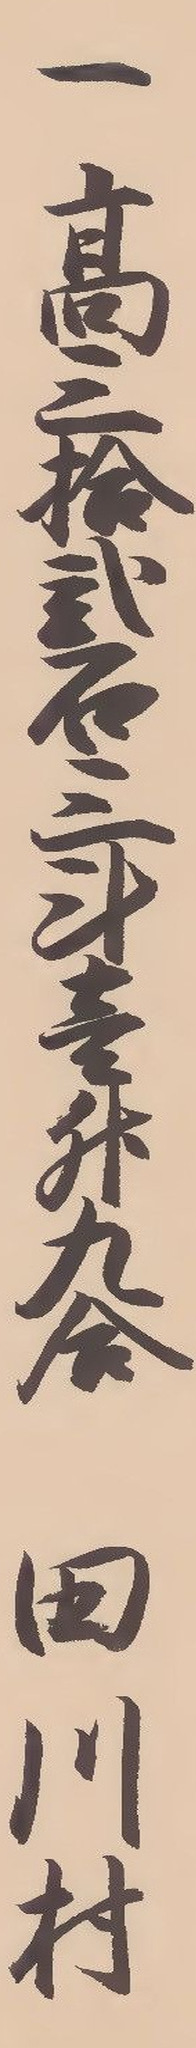一高三拾弐石三斗壱升九合田川村
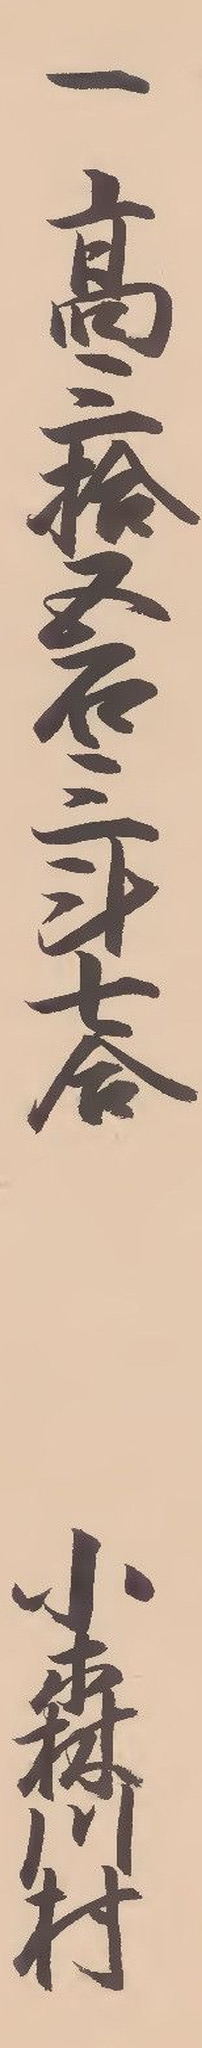一高三拾五石三斗七合小森川村
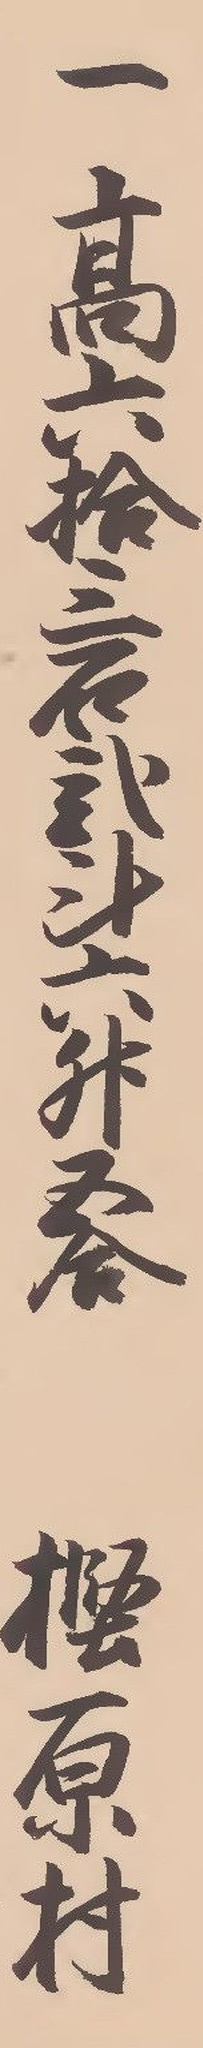一高六拾三石弐斗六升五合樫原村
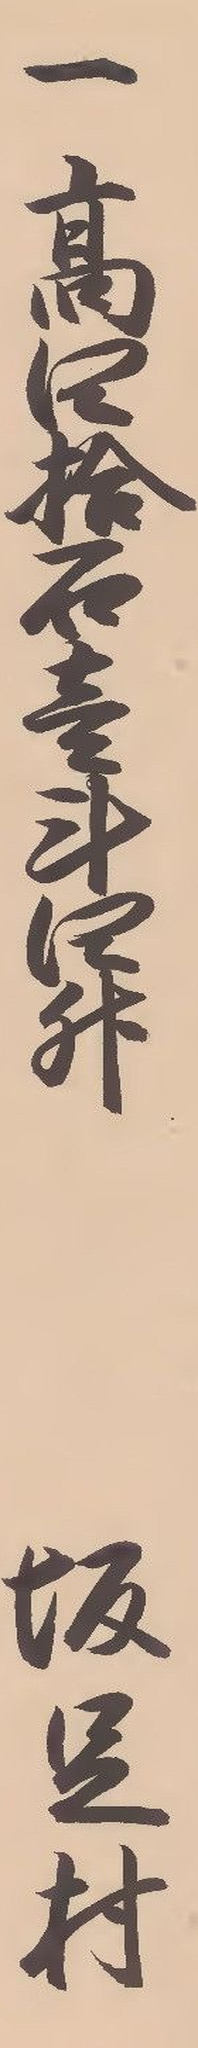一高四拾石壱斗四升坂足村
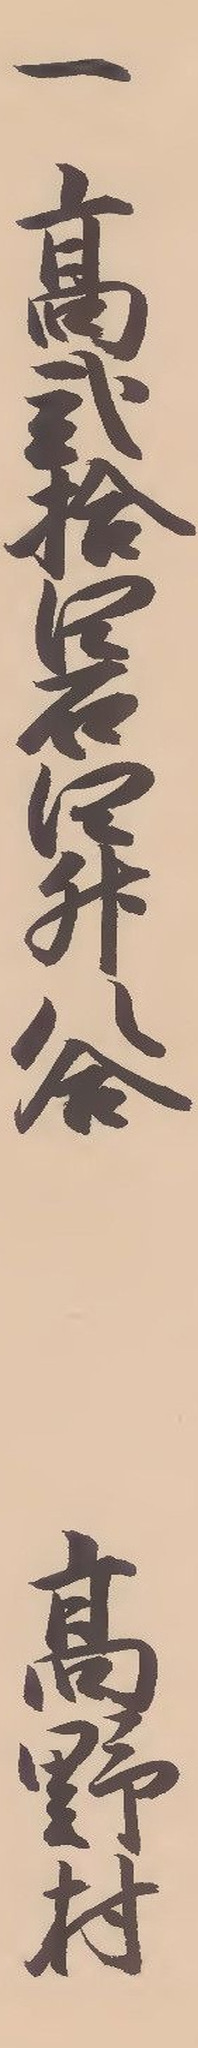一高弐拾四石四升八合高野村

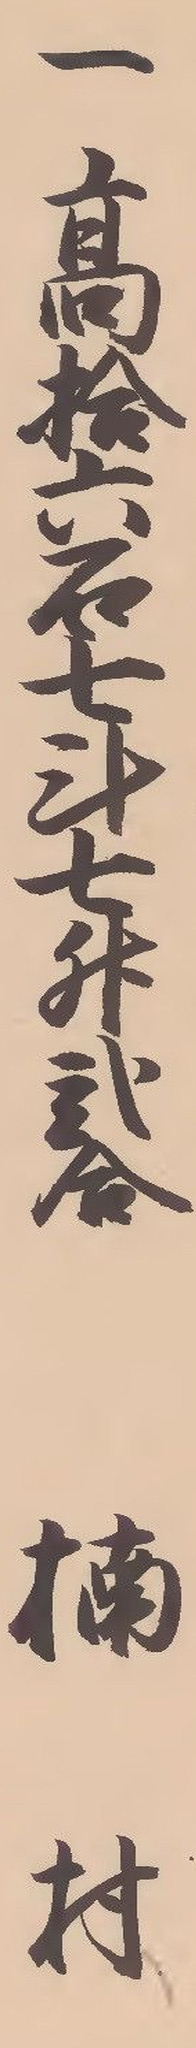一高拾六石七斗七升弐合楠村
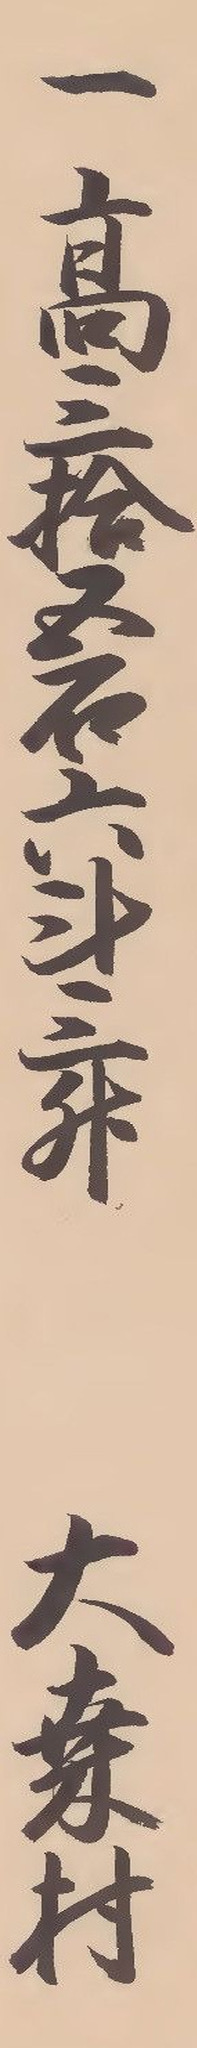一高三拾五石六斗三升大桑村
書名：紀伊国郷帳
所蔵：国立公文書館 National Archives of Japan
